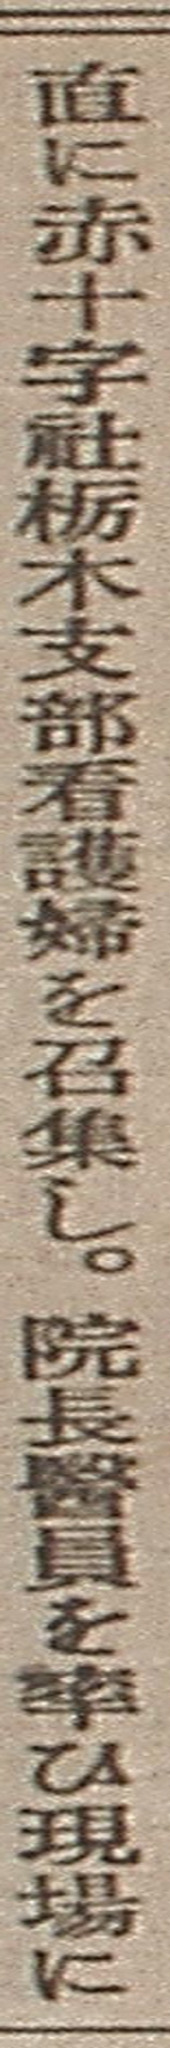直に赤十字社栃木支部看護婦を召集し。院長医員を率ひ現場に
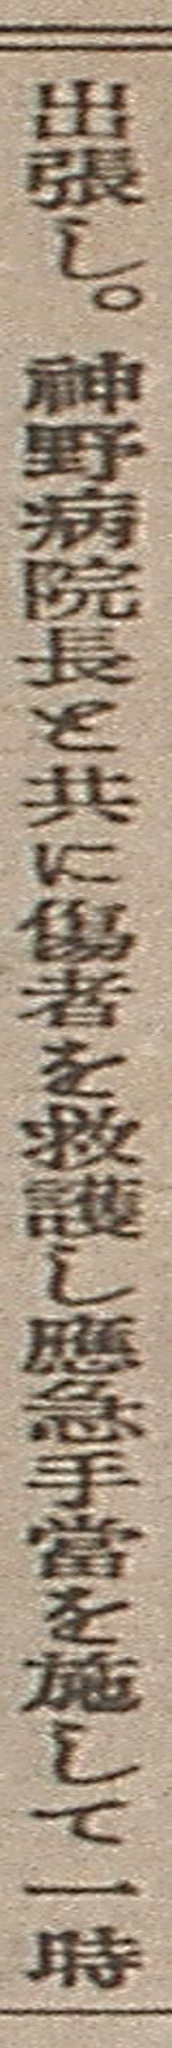出張し。神野病院長と共に傷者を救護し応急手当を施して一時
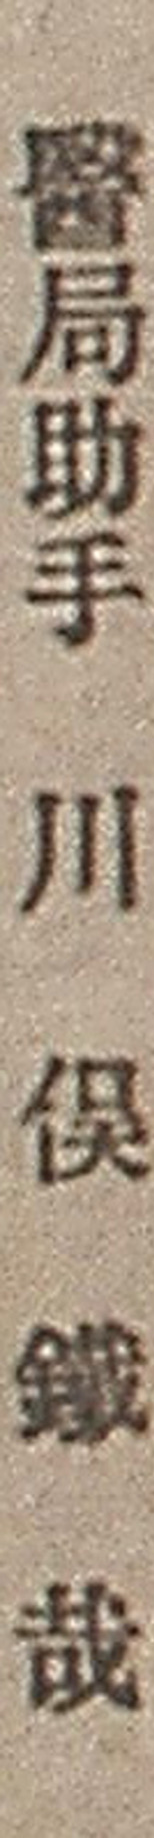医局助手川俣鉄哉
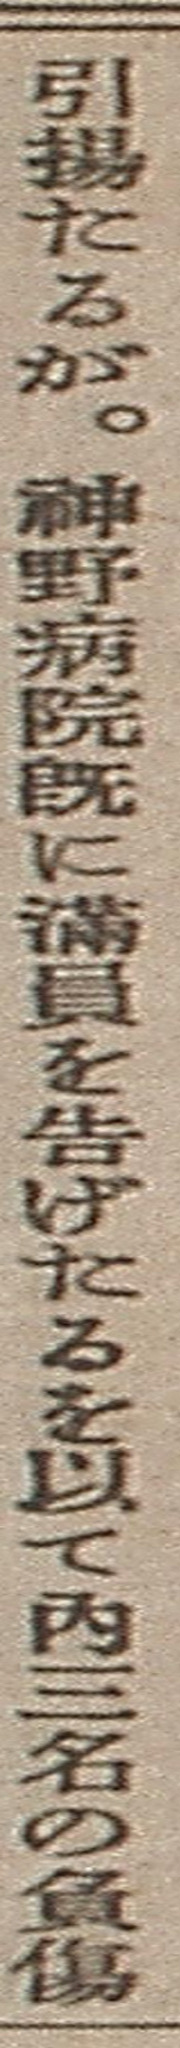引揚たるが。神野病院既に満員を告げたるを以て内三名の負傷
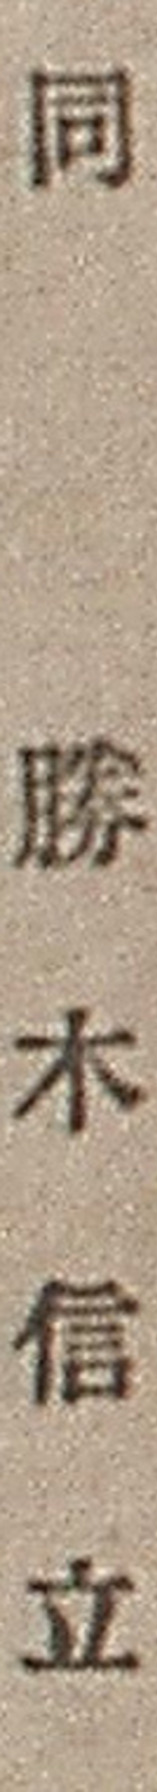同勝木信立
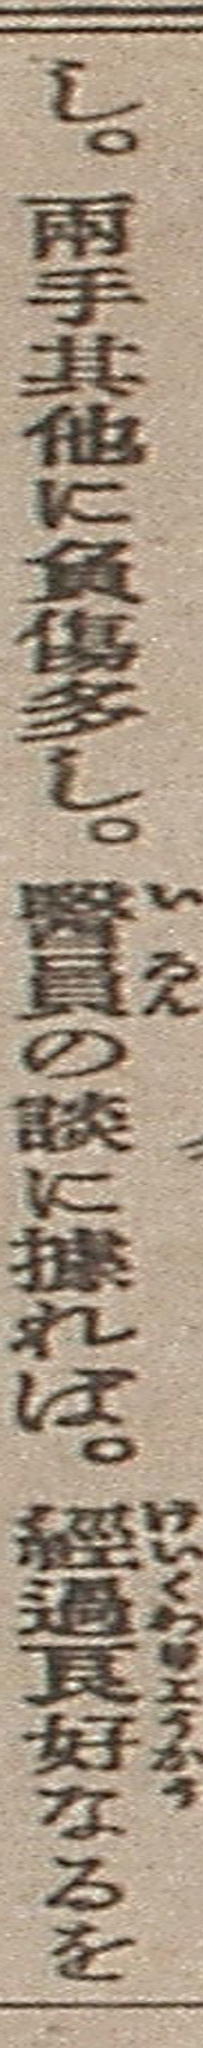し。両手其他に負傷多し。医員の談に拠れば。経過良好なるを
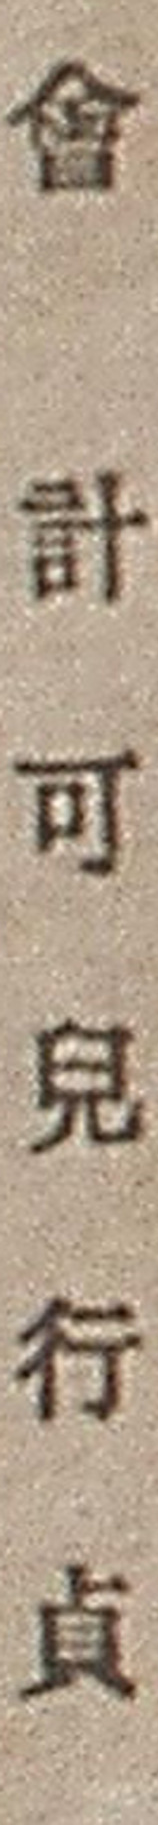会計可児行貞
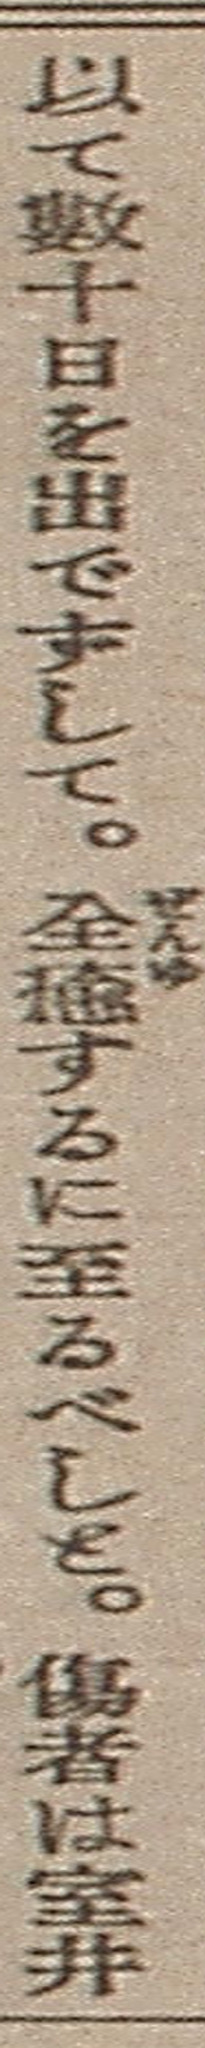以て数十日を出でずして。全癒するに至るべしと。傷者は室井
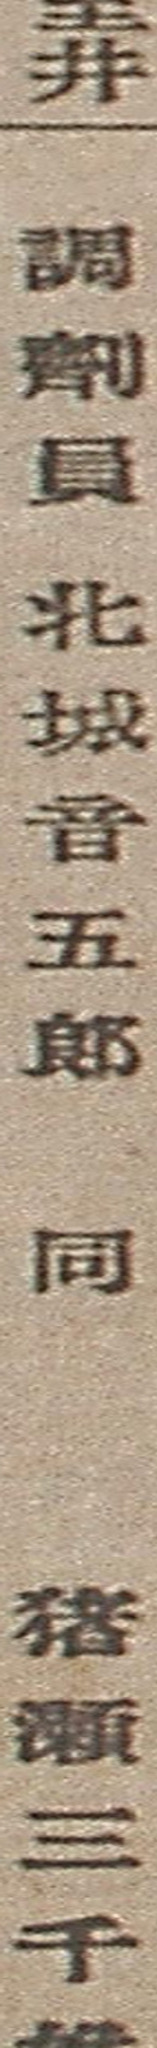調剤員北城音五郎同猪瀬三千雄
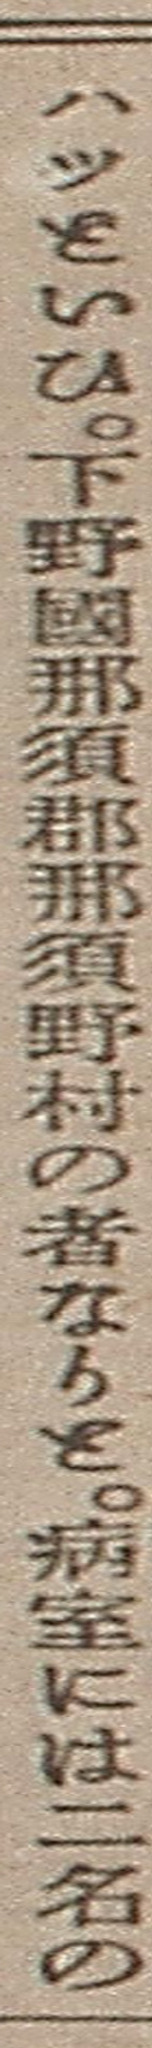ハツといひ。下野国那須郡那須野村の者なりと。病室には二名の

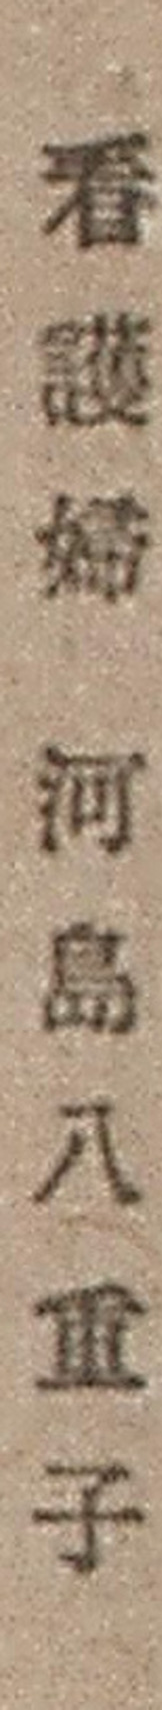看護婦河島八重子
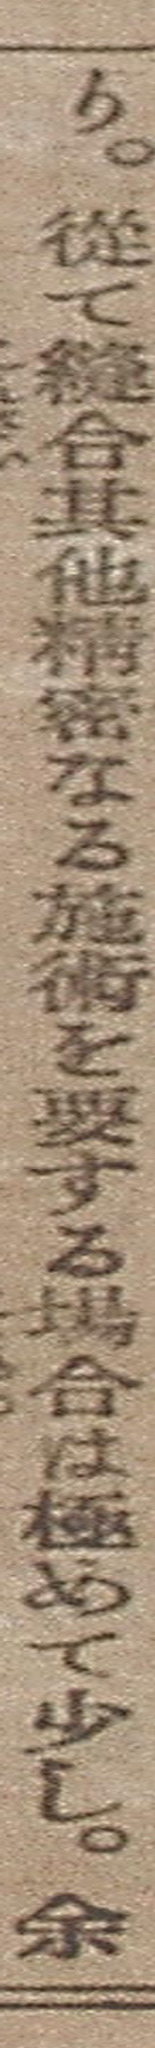り。従て縫合其他精密なる施術を要する場合は極めて少し。余
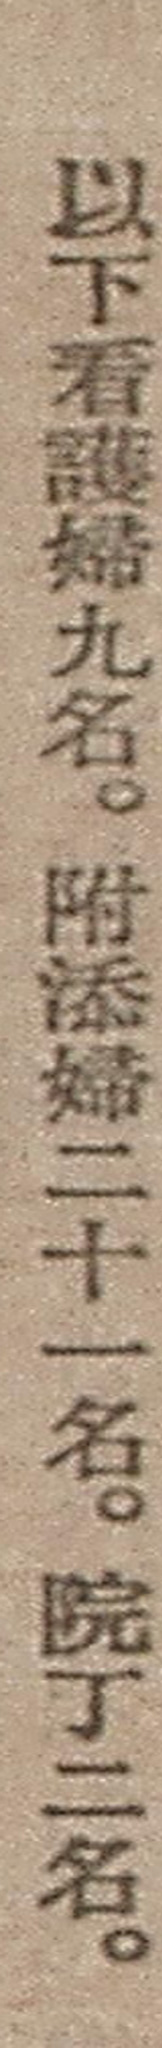以下看護婦九名。付添婦二十一名。院丁二名。
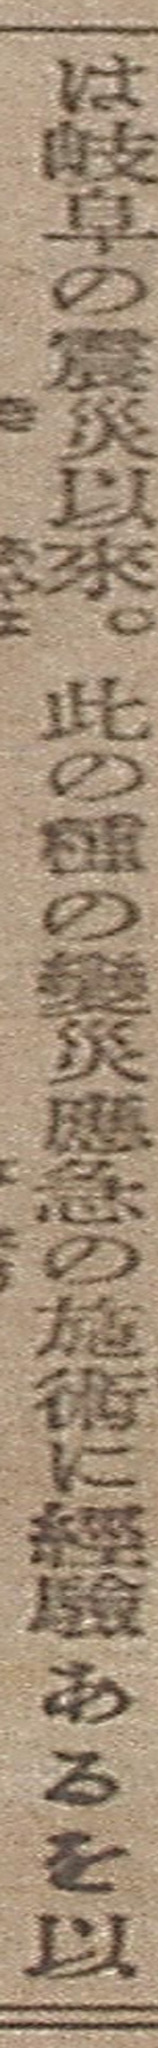は岐阜の震災以来。此の種の変災応急の施術に経験あるを以
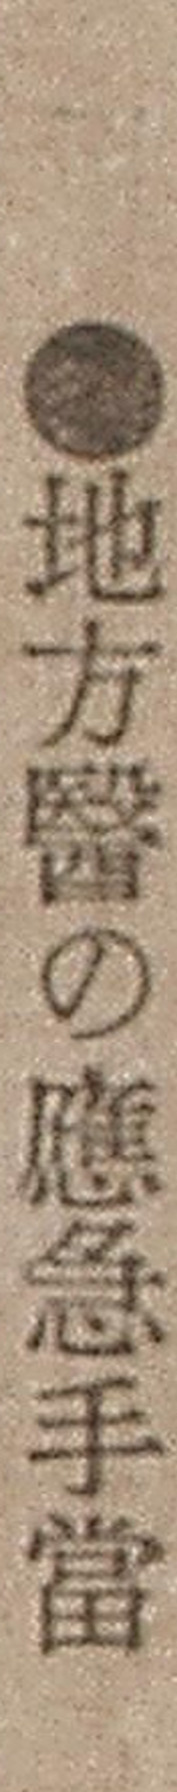●地方医の応急手当
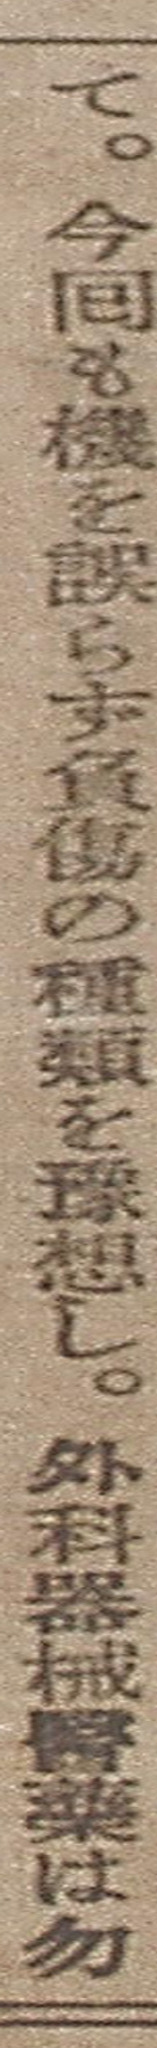て。今回も機を誤らず負傷の種類を予想し。外科器械医薬は勿
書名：風俗畫報臨時増刊第百九十九號　明治三十二年十月各地災害圖會（前編之續）
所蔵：東京大学地震研究所図書室 Earthquake Research Institute Library, The University of Tokyo, JAPAN
